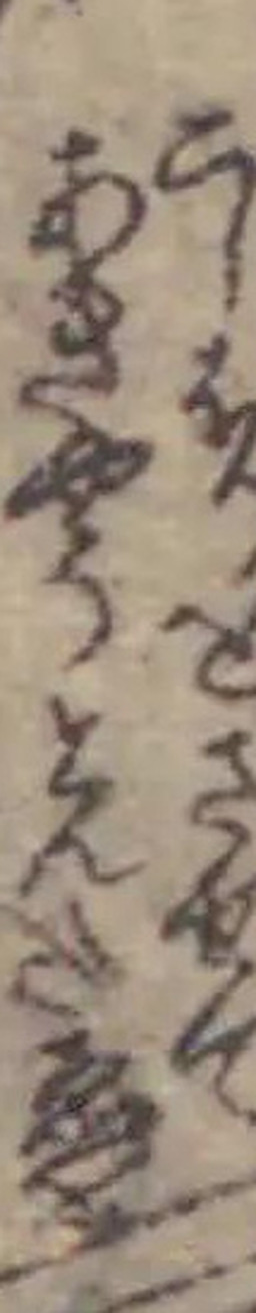あきやうとんたゑを
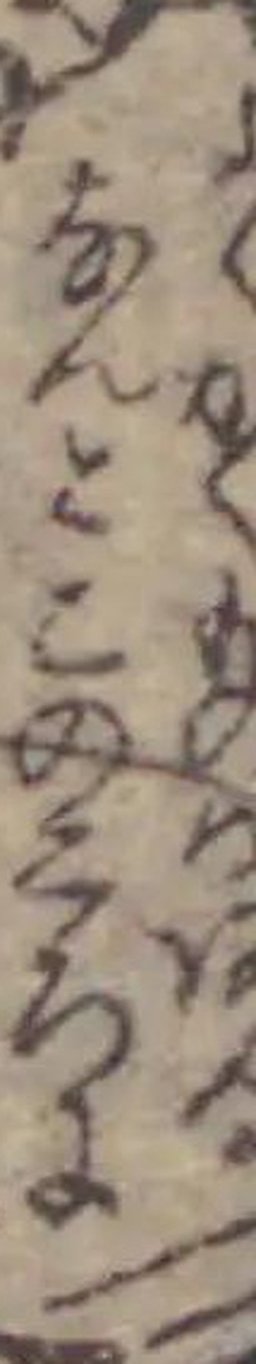なんとこのころ
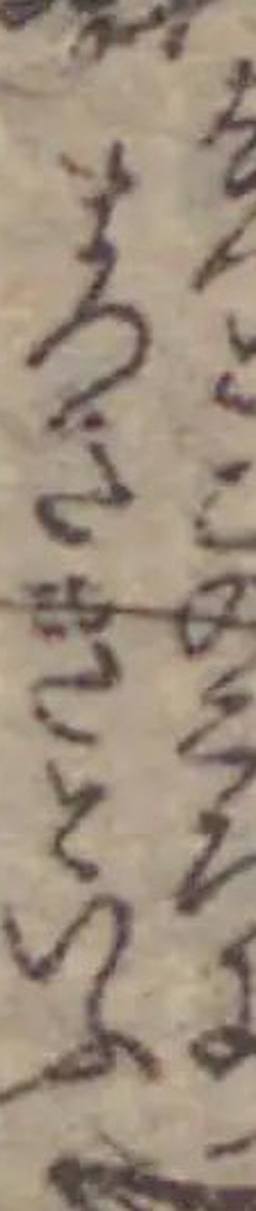まつさきといふ
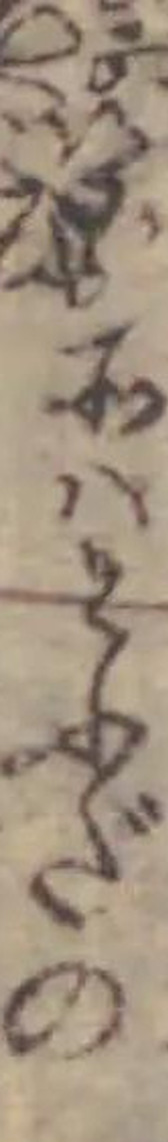所はとふだの
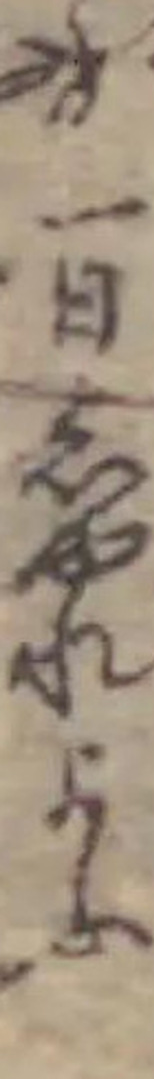一日しやれよふ
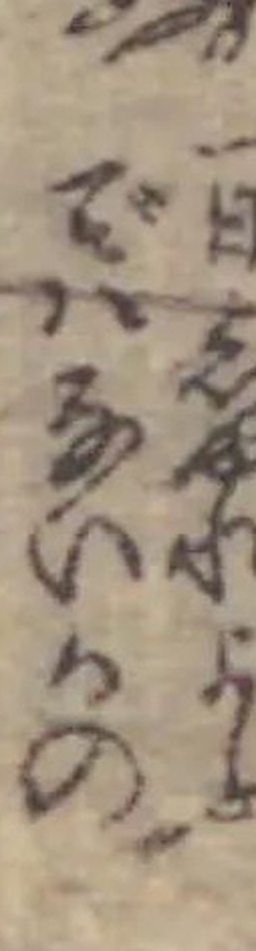ではないかの
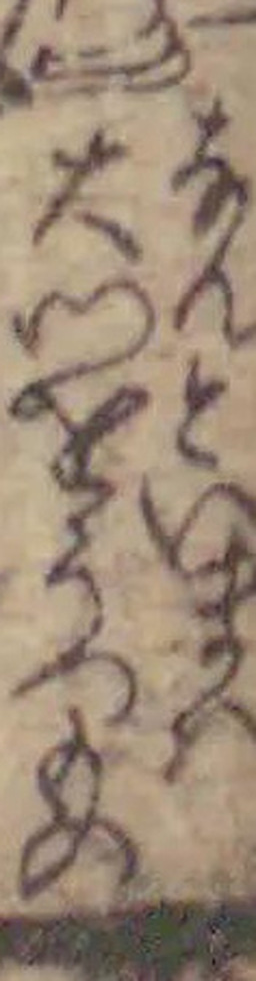大門をうつもの
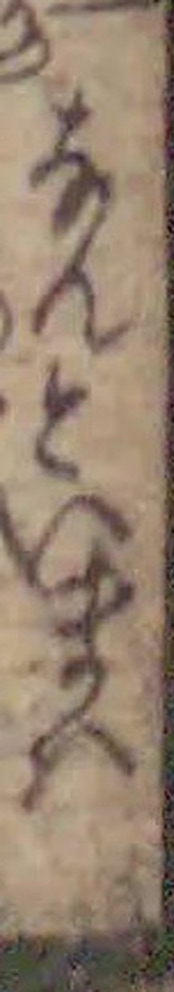なんといまは
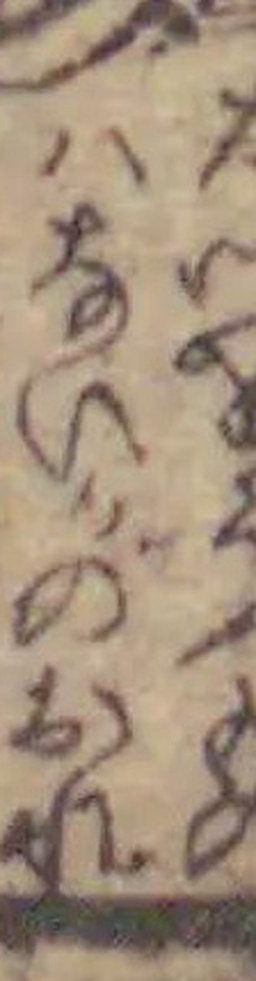はないかのおれ
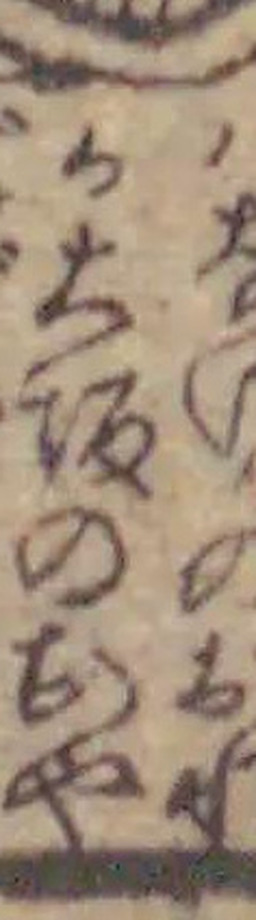か大阪のおや
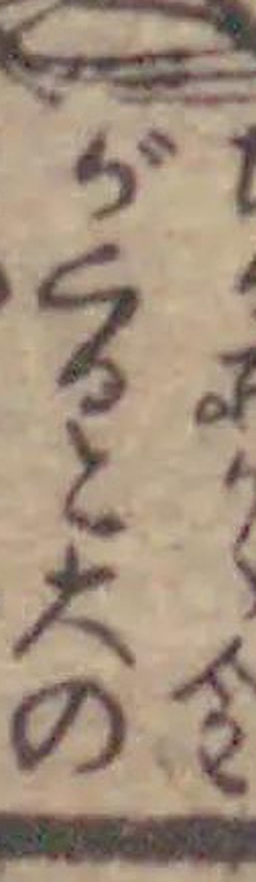がくると大の
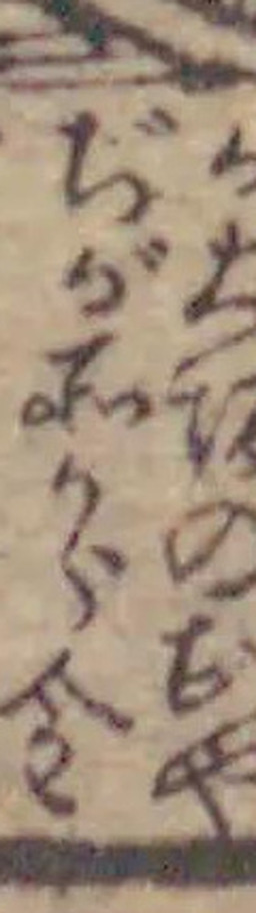ぢが所から金
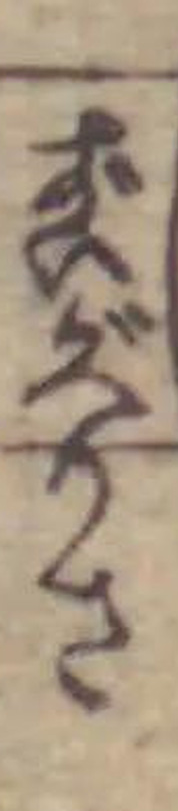ずいがへりさ
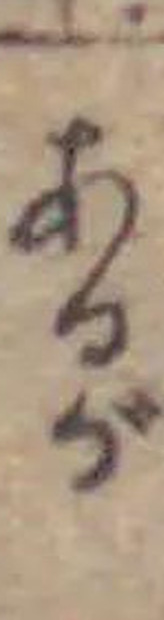あるが
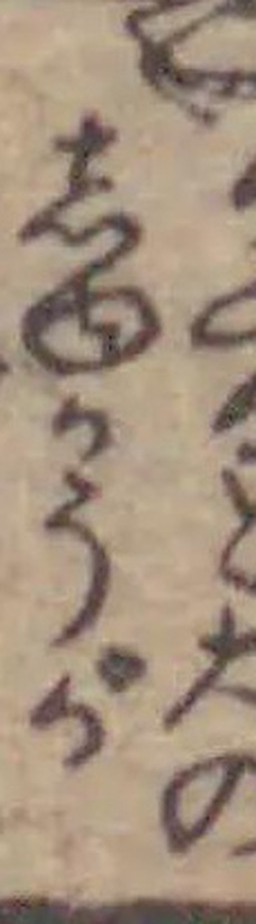しゆかうが
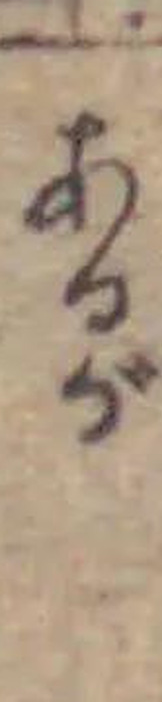あるが
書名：虚言弥二郎傾城誠 3巻
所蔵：国立国会図書館 National Diet Library, JAPAN
